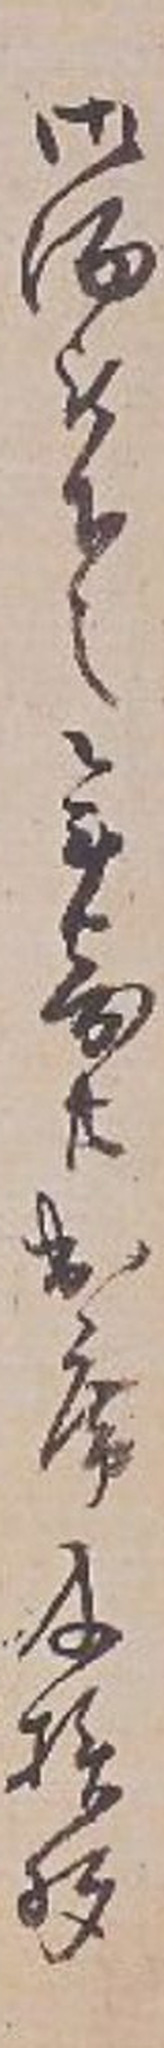御酒被下之年寄共出席及挨拶
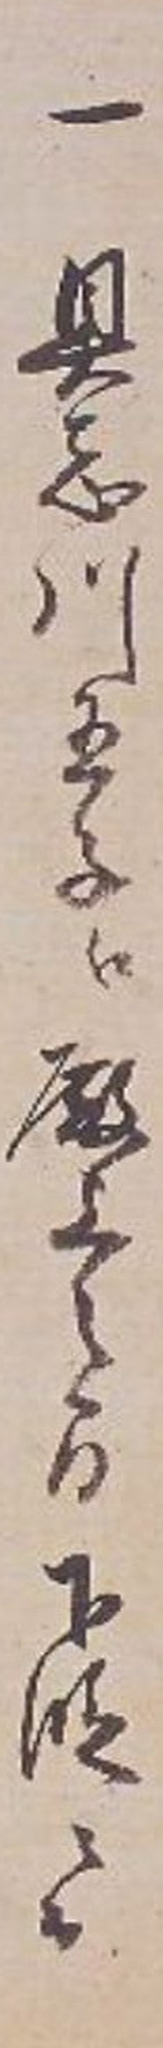一具志川王子え殿上之間下段に而
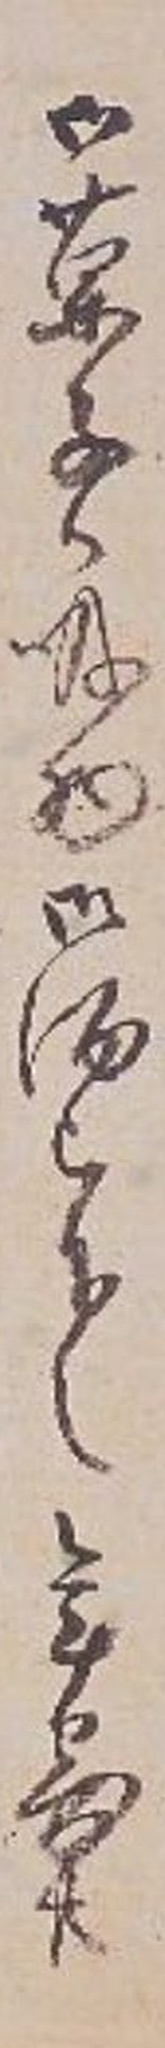御菓子御吸物御酒被下之年寄共
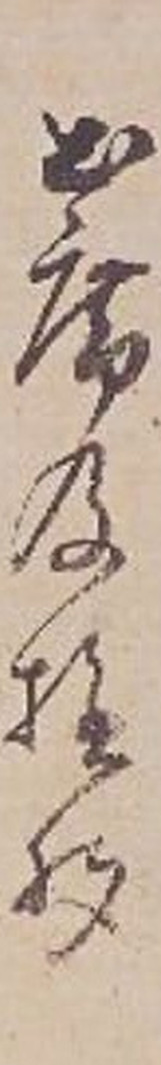出席及挨拶
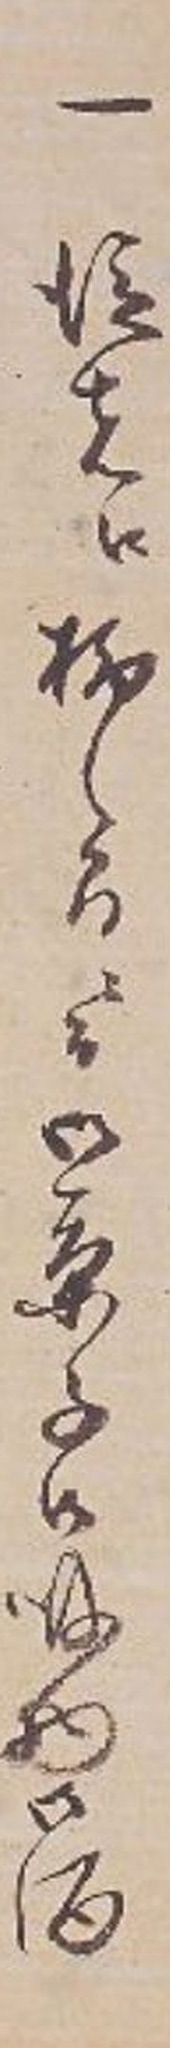一従者え柳之間に而御菓子御吸物御酒
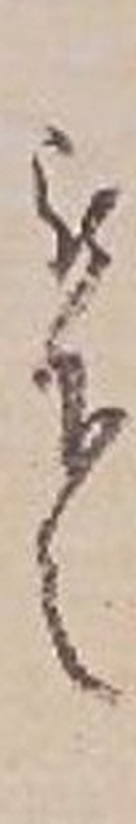被下之
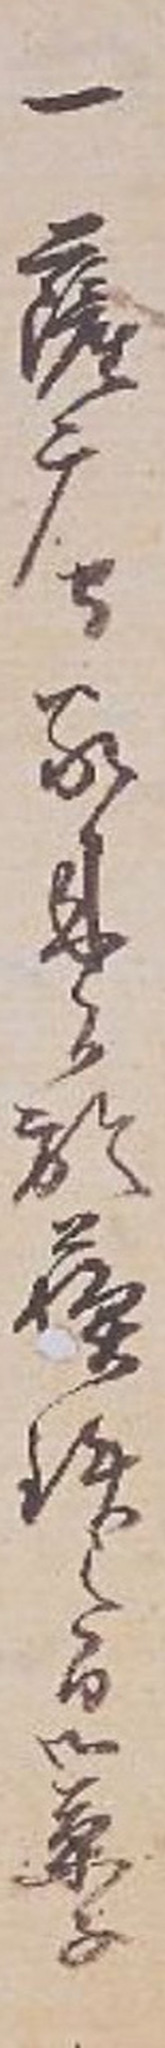一薩摩守家来に於蘇鉄之間御菓子
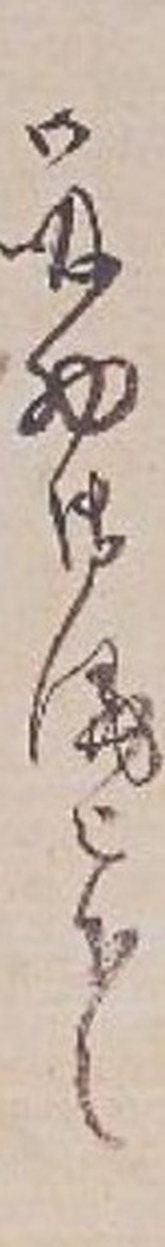御吸物御被下之
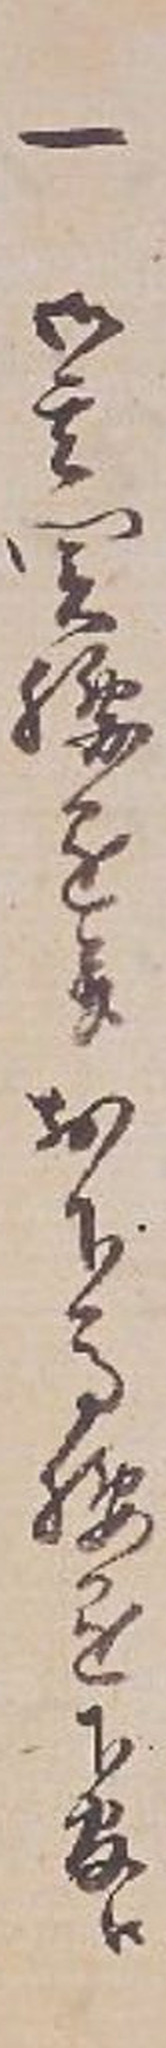一御玄関腰懸幷於下馬腰懸下官え
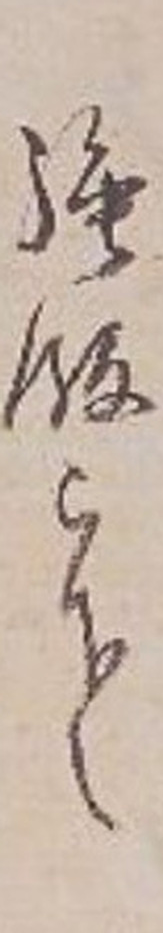強飯被下之
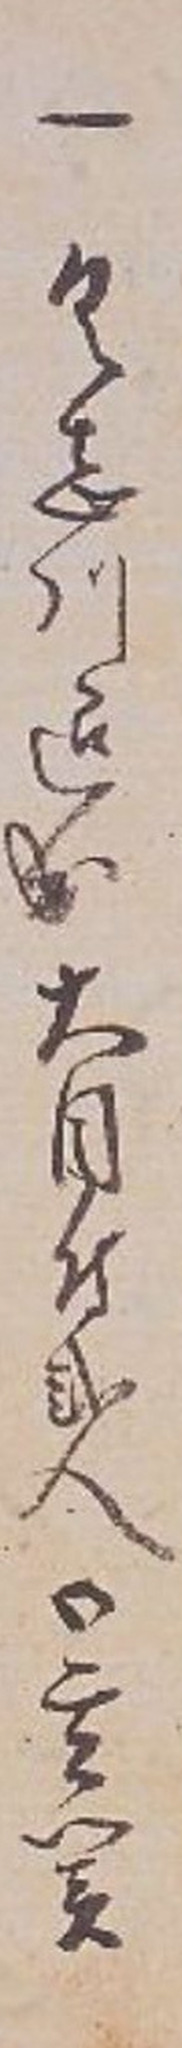一具志川退出大目付弐人御玄関
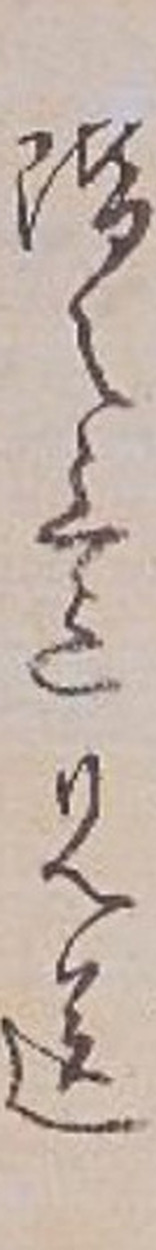階之上迄見送

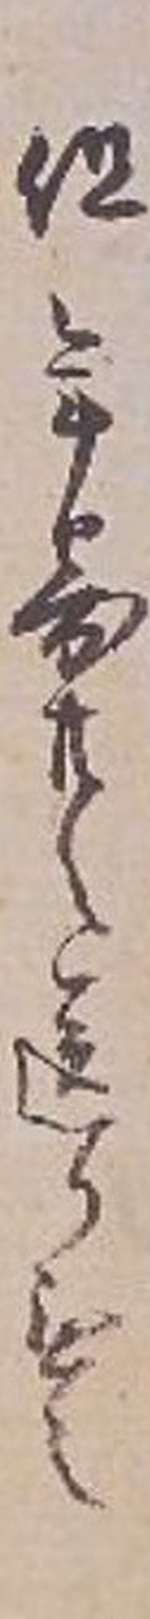但年寄共之送り無之
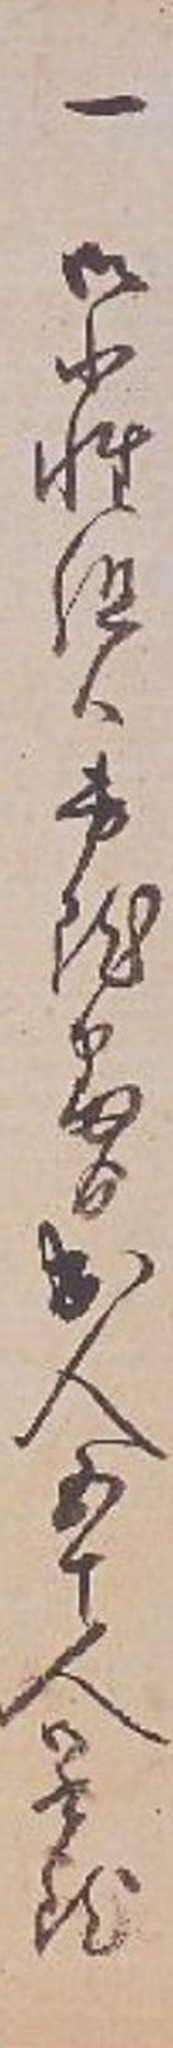一御小性組御書院番ゟ出人五十人御書院
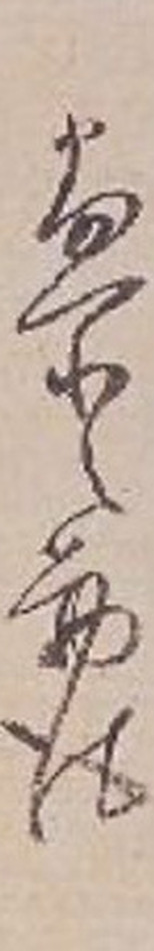番所々勤仕
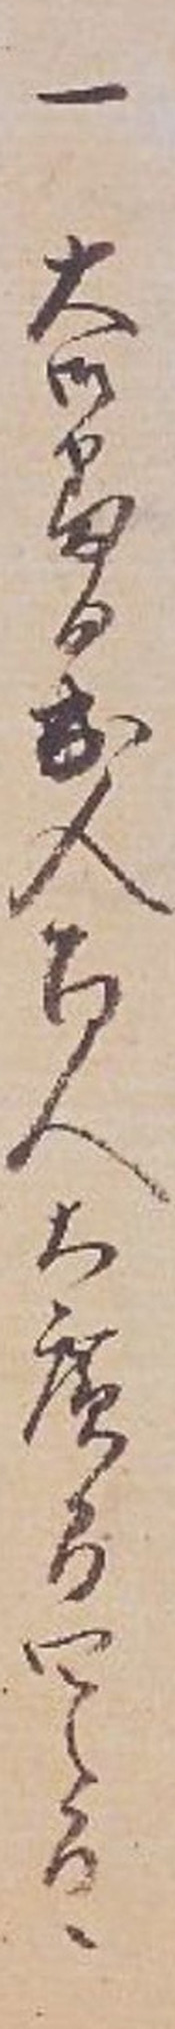一大御番ゟ出人百人大広間四之間へ
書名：琉球人来朝記 八、九
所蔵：University of the Ryukyus Library
